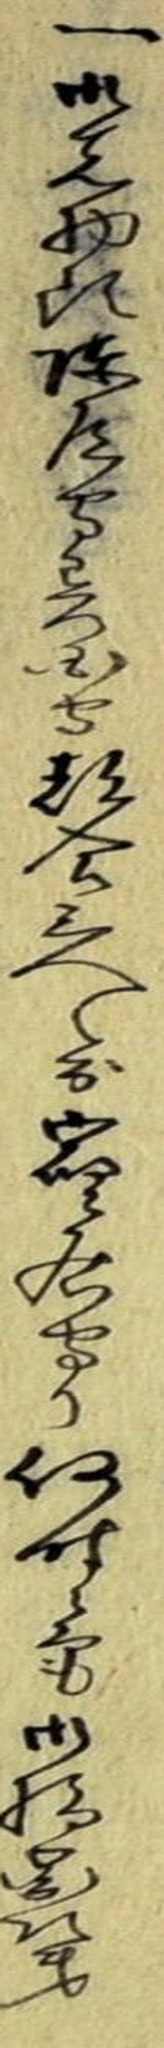一御先物頭陣屋守異国守都合三人之分宿々居守り何時に而も御指図次第
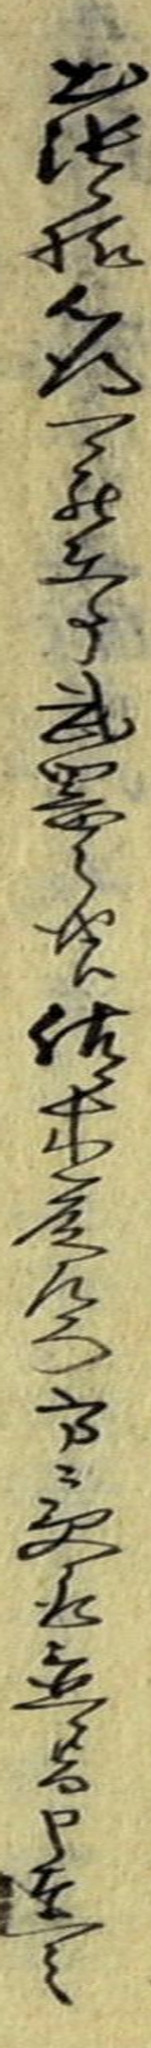出張候様心得可罷在事武器之儀は佐々木藤左衛門方に受取置候旨申達之
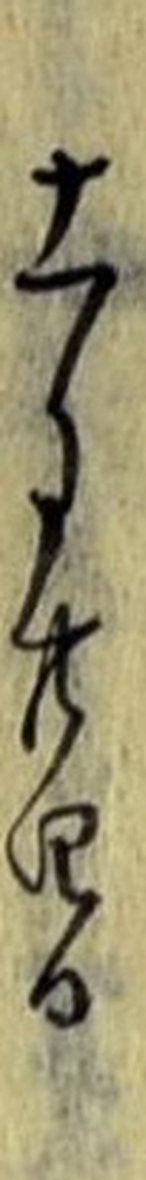十一月廿四日
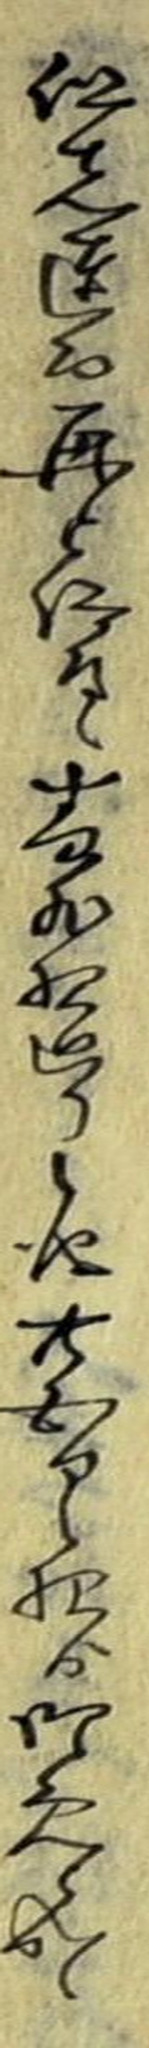但先達而再被仰付候番外夜廻り之儀廿五日之夜ゟ御免被成候
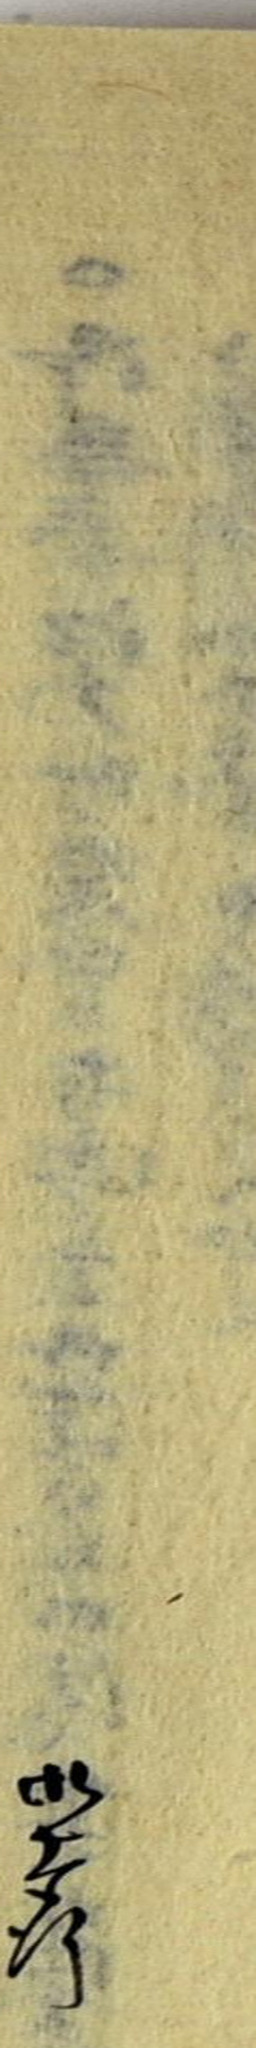御奉行
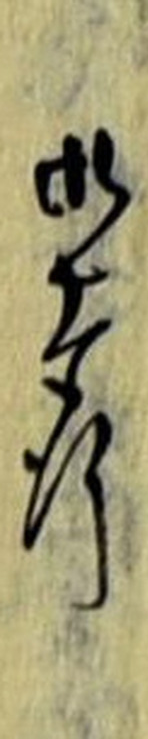御奉行

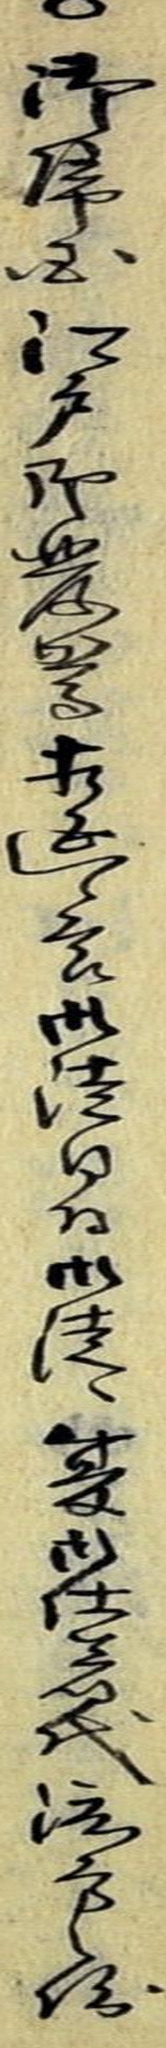○御帰国江戸御発駕相延候節御徒目付御徒へ夏御仕着代渡方之儀
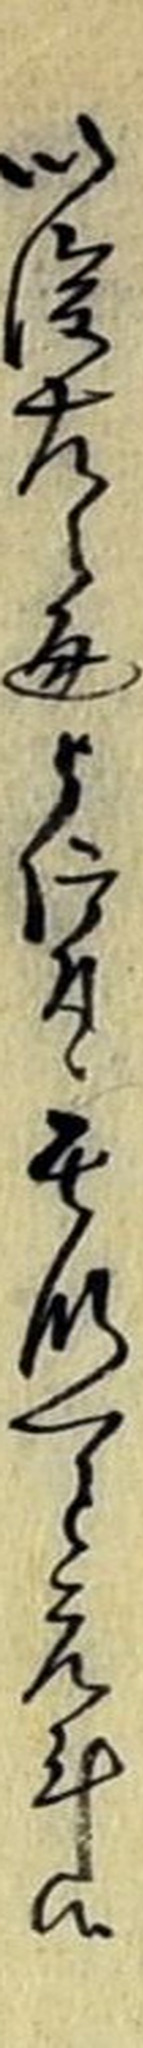以後左之通被仰付候其段可被取斗候
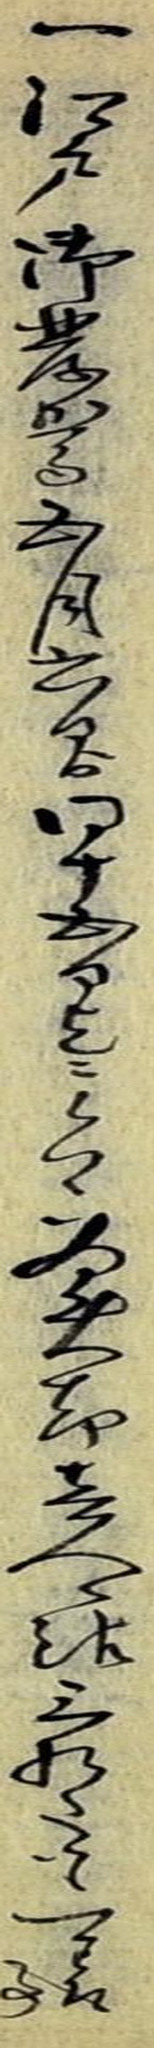一江戸御発駕五月六日ゟ同十五日迄に候ハゝ為失却壱人へ銀三拾匁つヽ可被下候
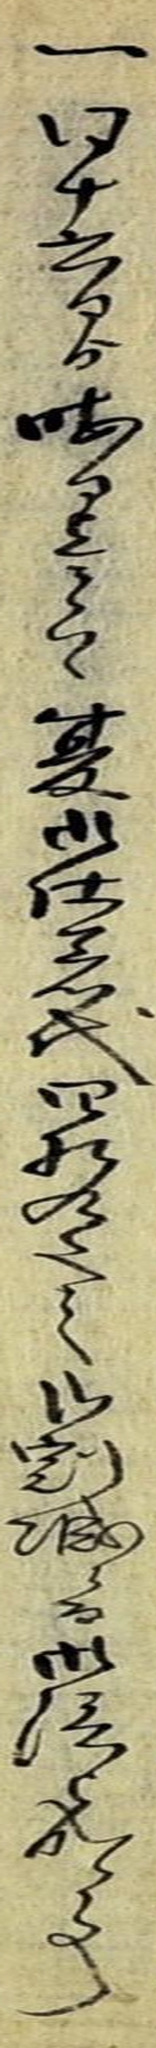一同十六日ゟ晦日までに候はヽ夏御仕着代四拾九匁之御割減に而御渡被成候事
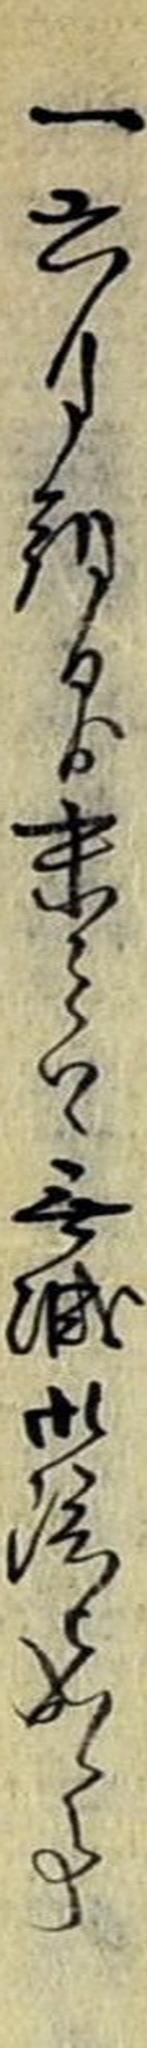一六月朔日ゟ末に候はヽ無減御渡被成候事
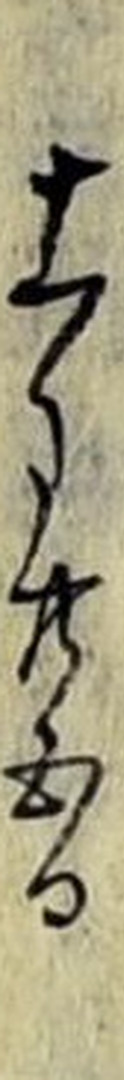十一月廿五日
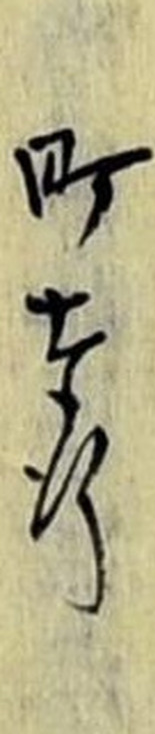町奉行
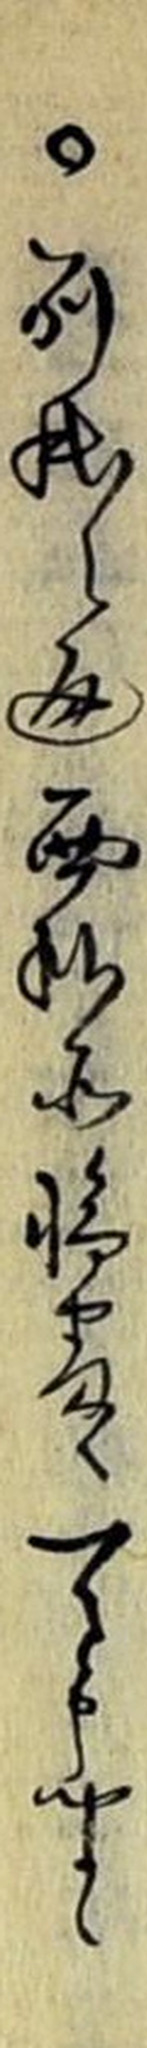○別紙之通西掛所輪番へ可被申聞候
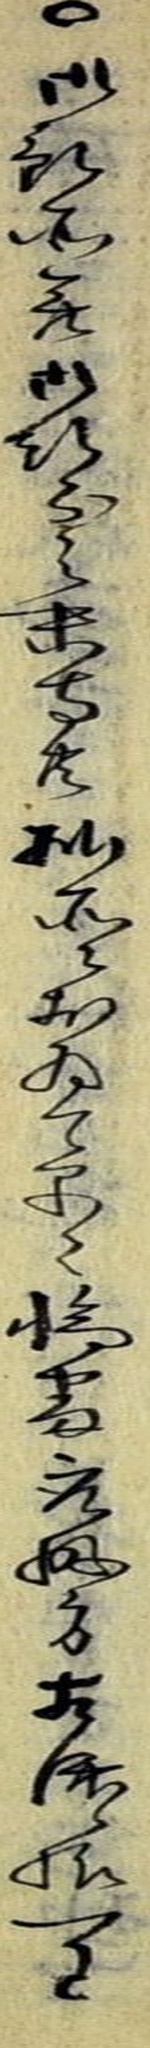○御預所并御領分之末寺共掛所におゐて早々輪番取扱方相済候様可被
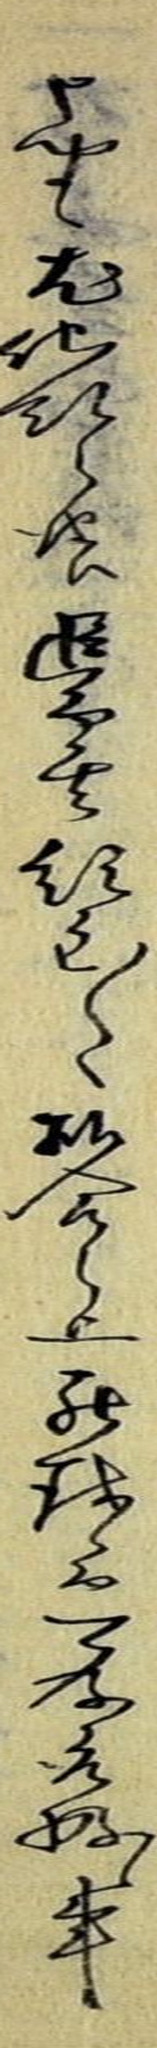申聞候尤他領之儀は追而其領主〳〵へ掛合之上罷越候而可及取扱候事
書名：命令之部 四
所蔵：福井県文書館 Fukui Prefectural Archives
